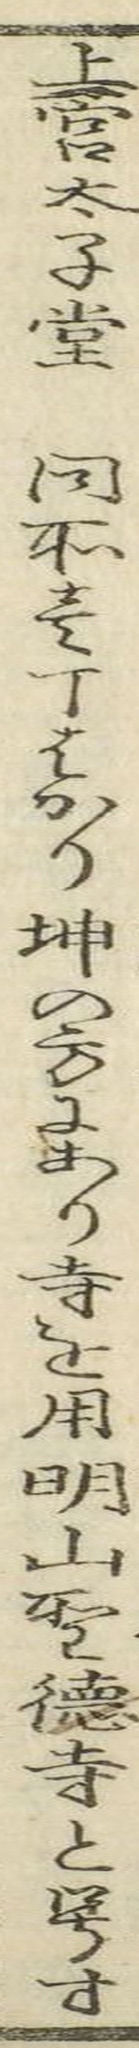上宮太子堂同所壱丁はかり坤の方にあり寺を用明山聖徳寺と号す
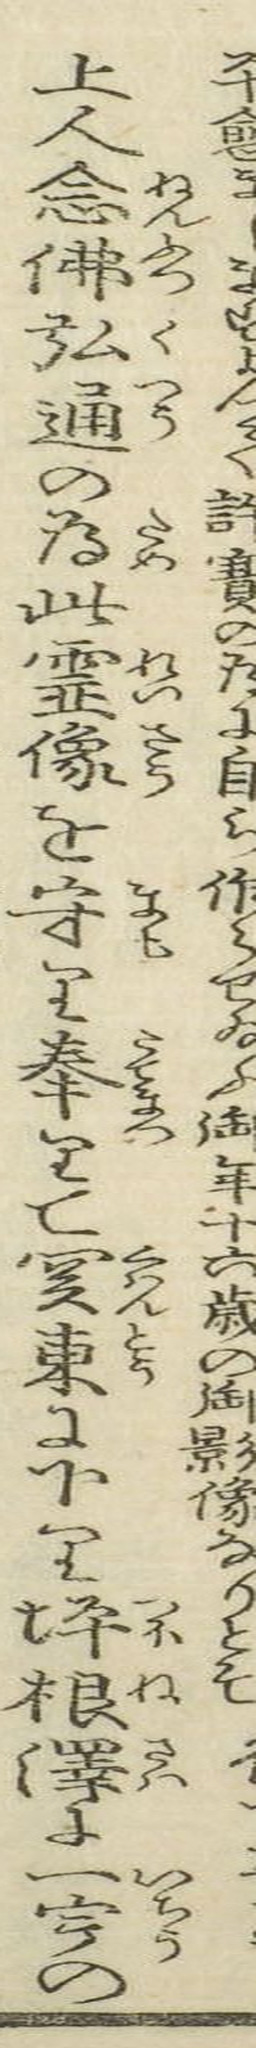上人念仏弘通の為此霊像を守り奉りて関東に下り坪根沢に一宇の
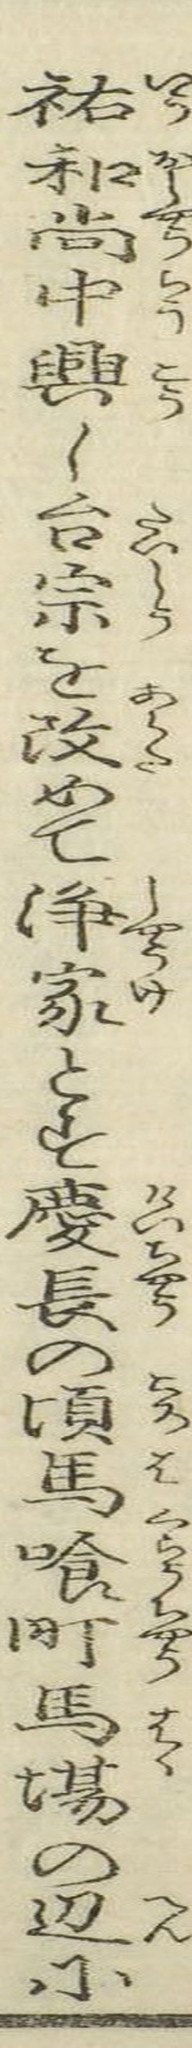祐和尚中興し台宗を改めて浄家とす慶長の頃馬喰町馬場の辺に
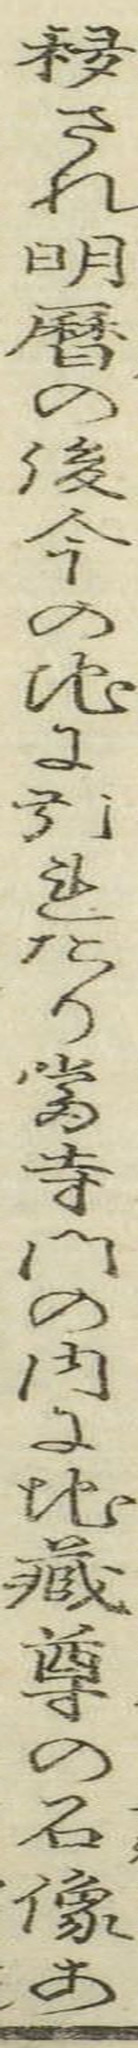移され明暦の後今の地に引れたり当寺門の内に地蔵尊の石像あ
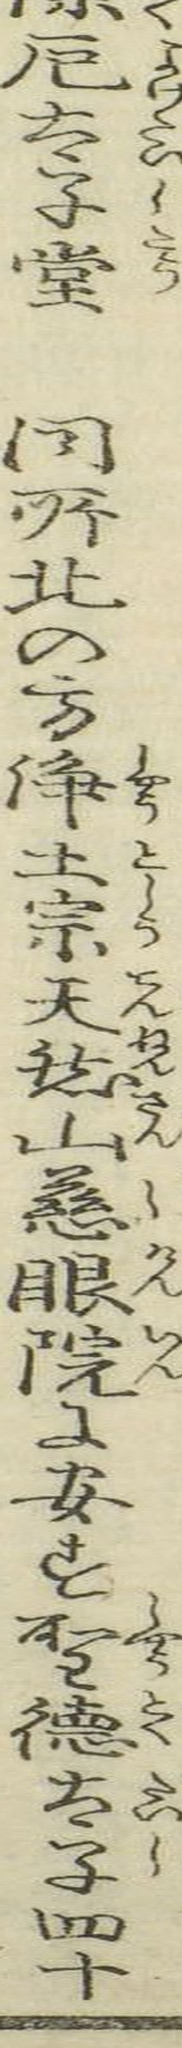除厄太子堂同所北の方浄土宗天然山慈眼院に安す聖徳太子四十
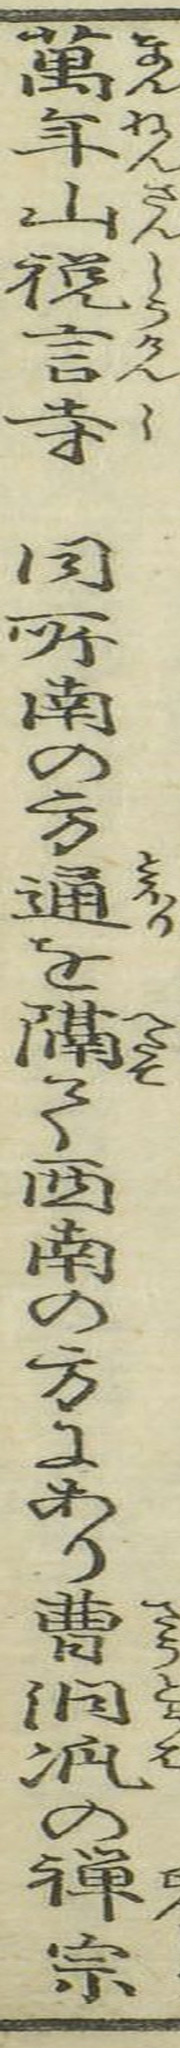萬年山祝言寺同所南の方通を隔て西南の方にあり曹洞派の禅宗

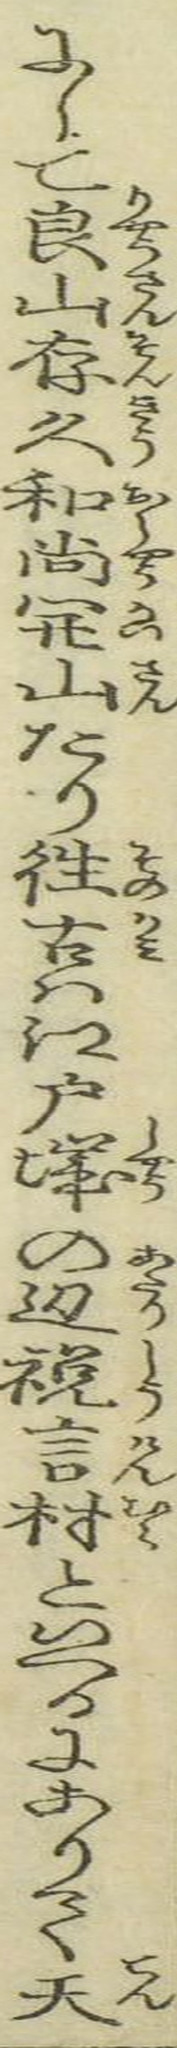にして良山存久和尚開山たり往古は江戸城の辺祝言村といへるにありて天
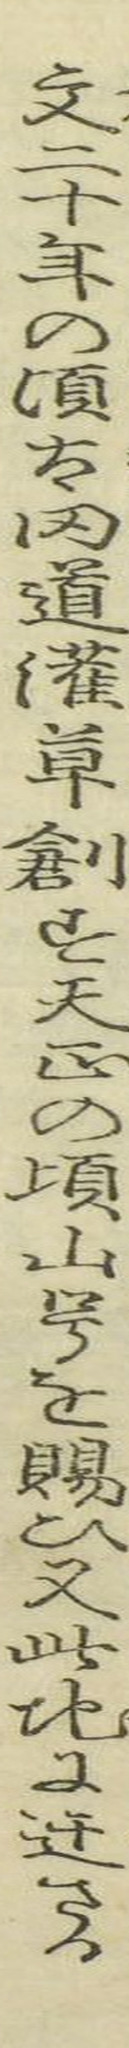文二十年の頃太田道灌草創す天正の頃山号を賜ひ又此地に遷さる
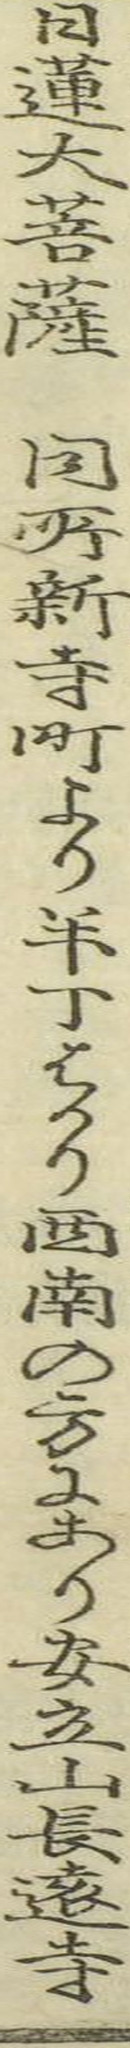日蓮大菩薩同所新寺町より半丁はかり西南の方にあり安立山長遠寺
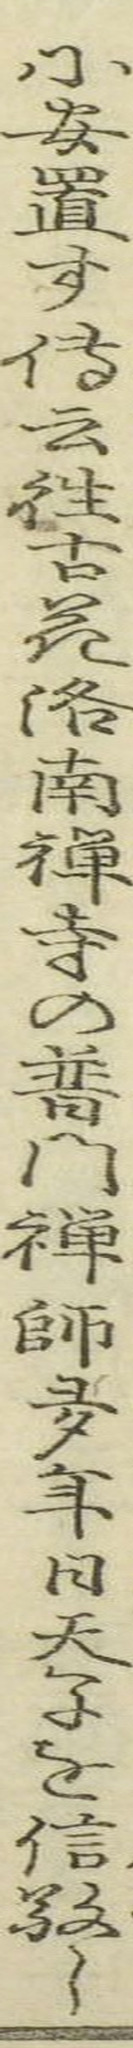に安置す伝云往古花洛南禅寺の普門禅師多年日天子を信敬し
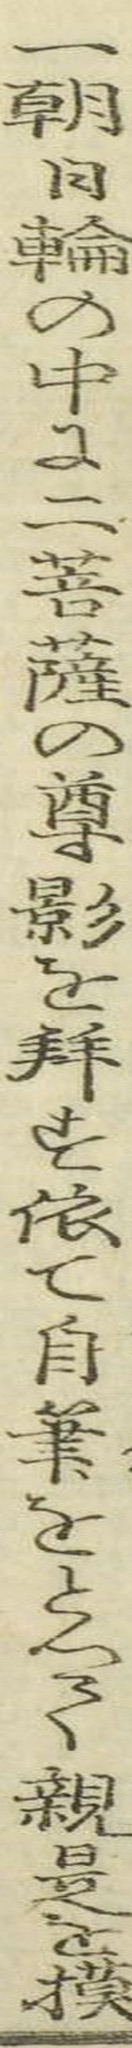一朝日輪の中に二菩薩の尊影を拝す依て自筆をとつて親是を摸
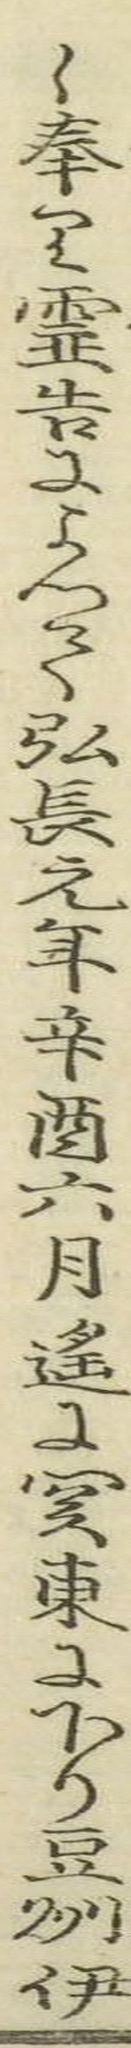し奉り霊告によつて弘長元年辛酉六月遥に関東に下り豆州伊
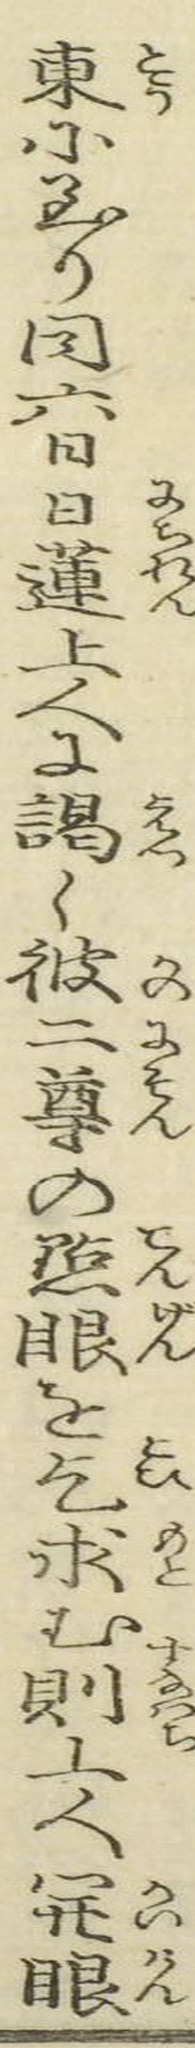東に至り同六日日蓮上人に謁し彼二尊の点眼を乞求む則上人開眼
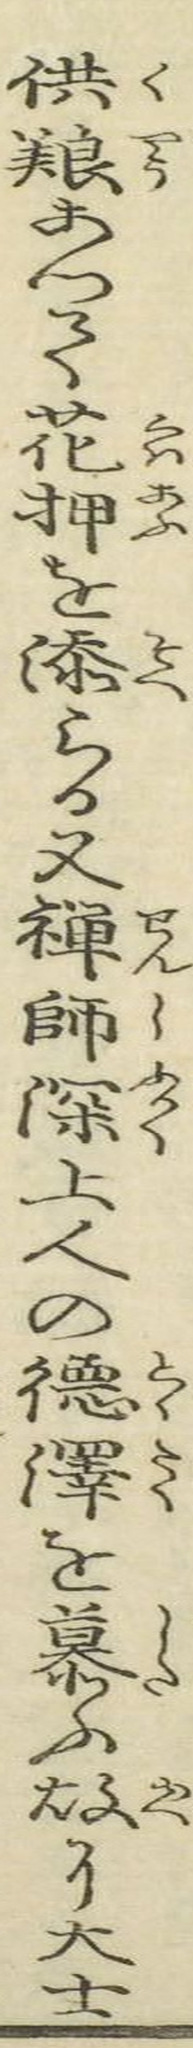供養あつて花押を添らる又禅師深上人の徳沢を慕ふ故に大士
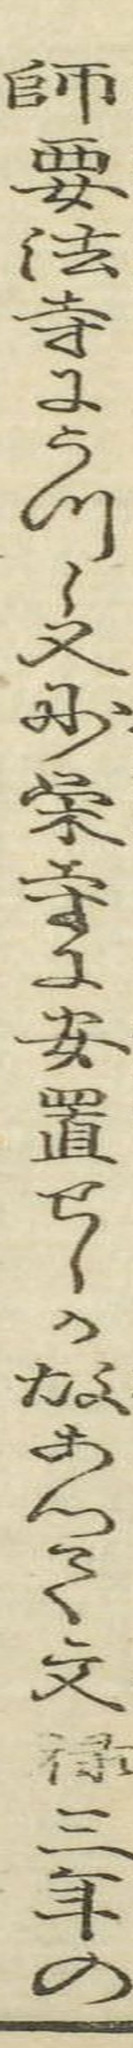師要法寺にうつし又妙栄寺に安置せしか故あつて文禄三年の
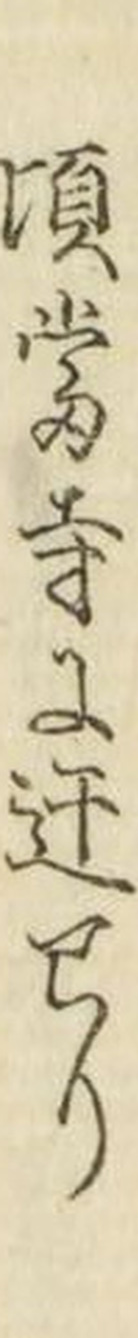頃当寺に遷せり
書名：江戸名所図会 20巻 巻之16
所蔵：東京学芸大学教育コンテンツアーカイブ
